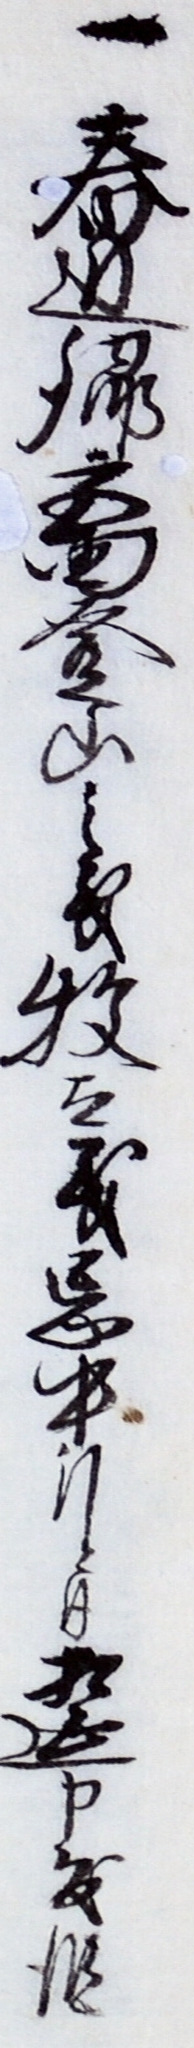春近郷宮田登山之義牧太義忌中引ニ付相延申度従
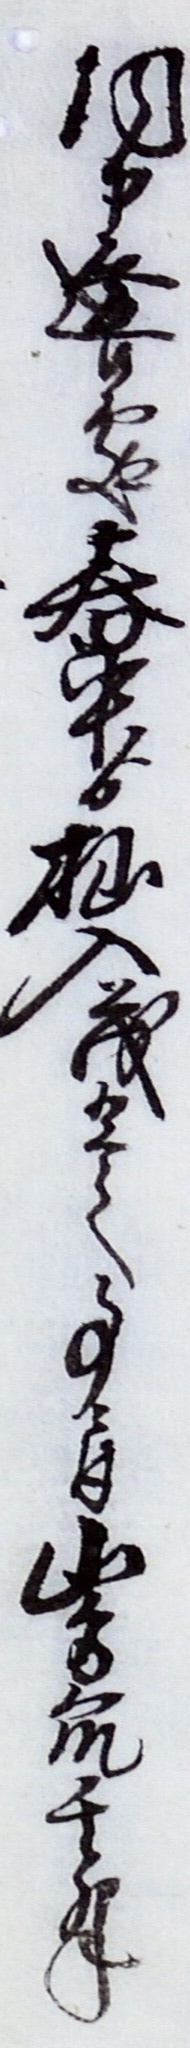伺申達候処春中より杣入も有之事ニ付山方衆其外
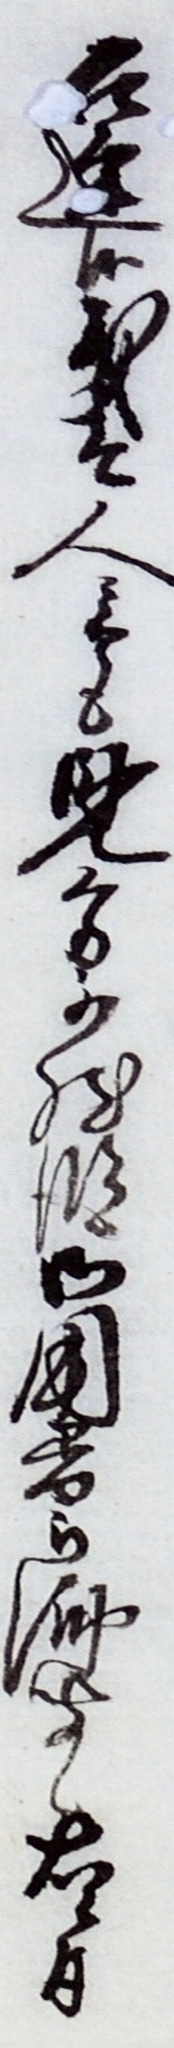相達候義壱人ニ而も見方可致段御用番御済聞候右ニ付
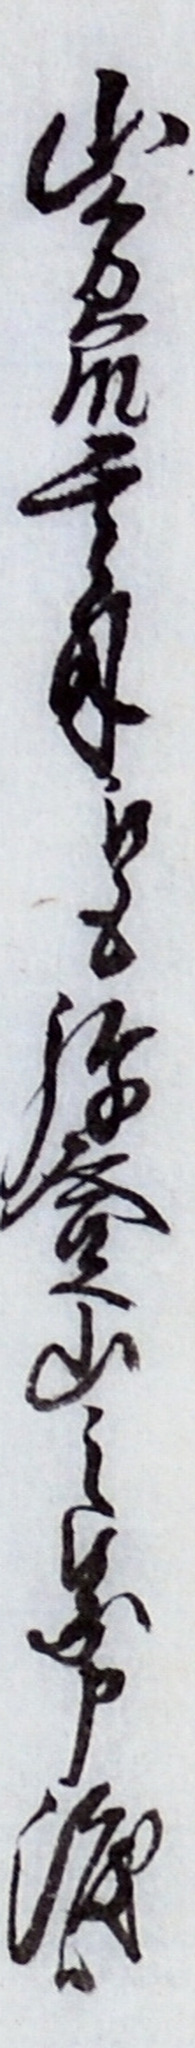山方衆其外江も弥登山之図申渡候
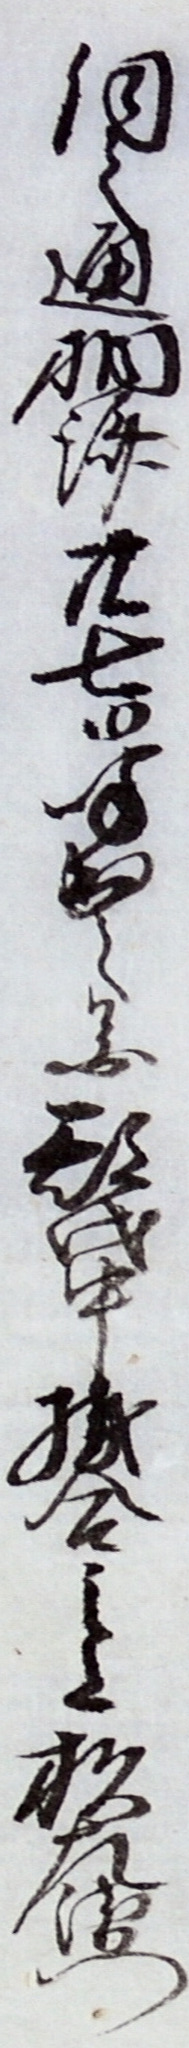調之通相済廿七日呼出に郡代中掛合之上杉左衛門
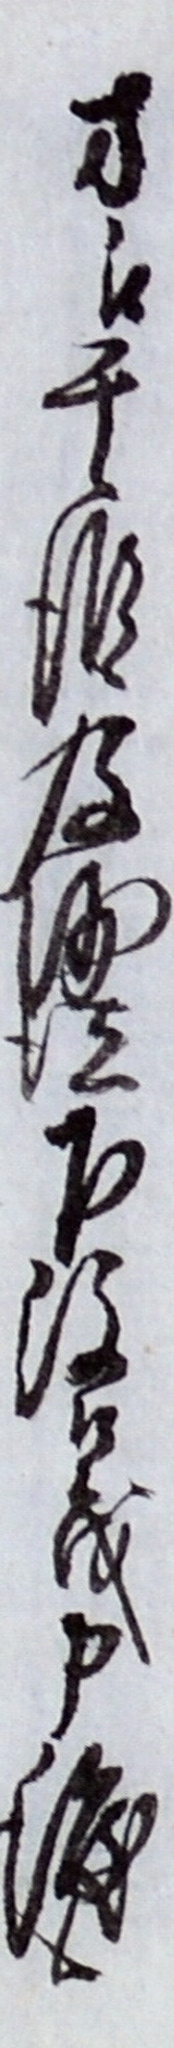方江其段及沙汰下約江も申渡候
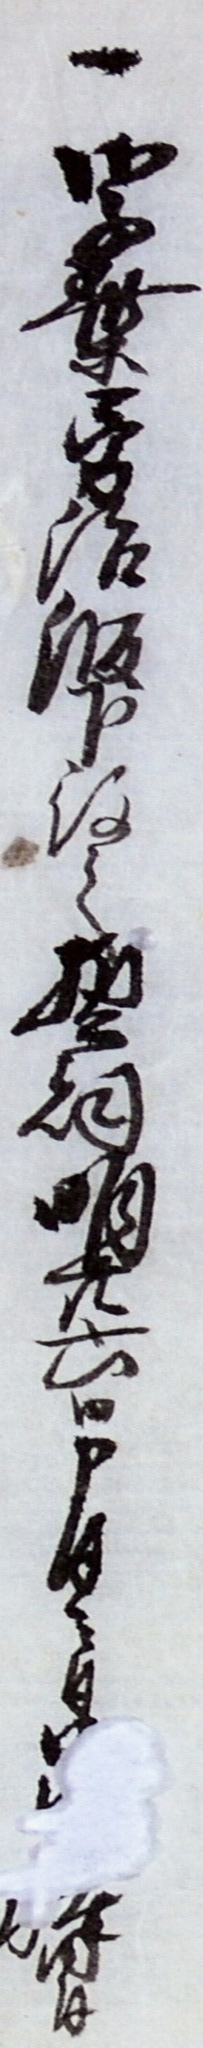一御子柴勇治様下役之誓詞明廿六日申付ニ付
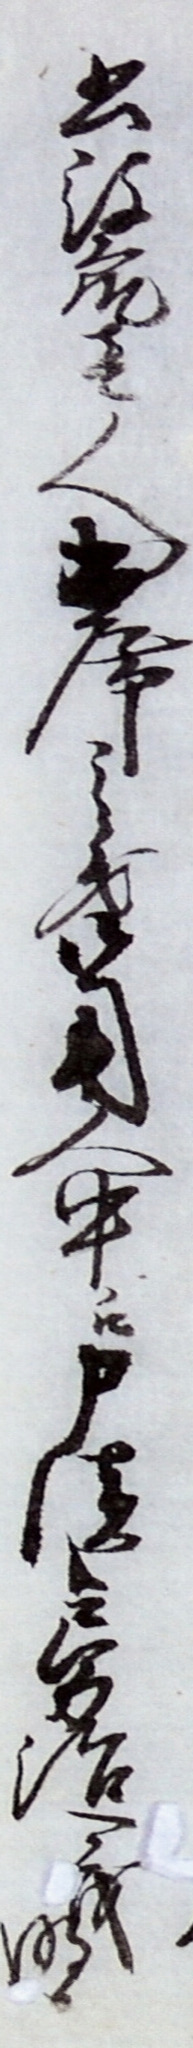書役衆壱人出席之義用人中江申談候宇治之義時々
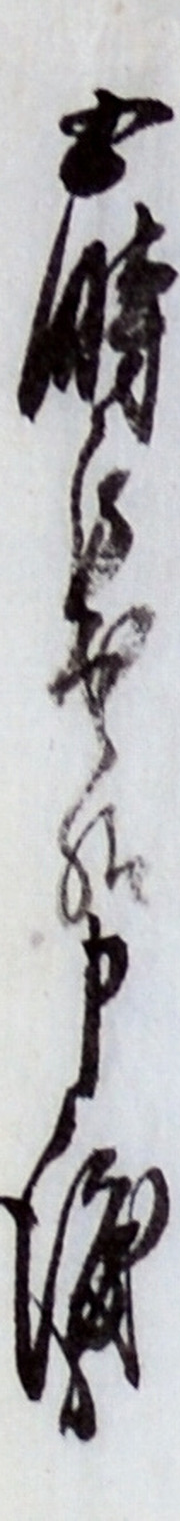五時罷出候様申渡候

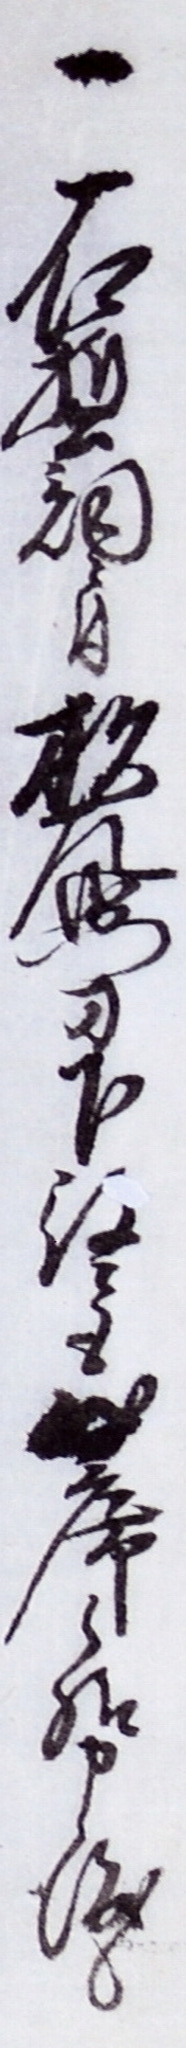一右誓詞ニ付杉左衛門下役ニも出席之様申渡候
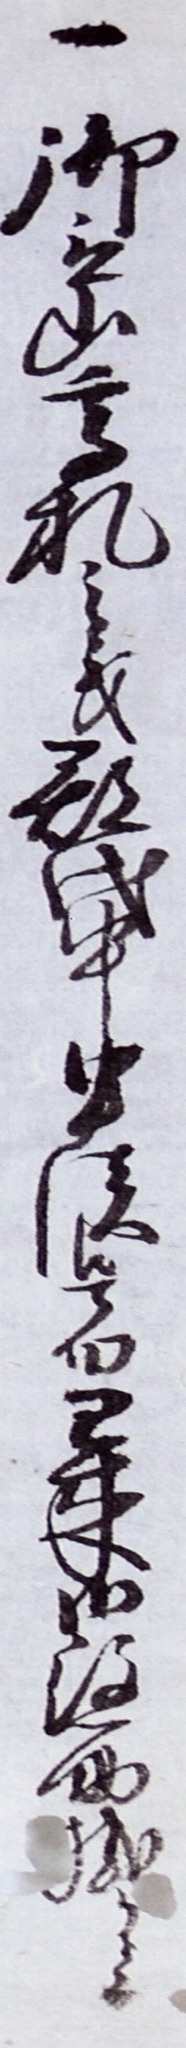一御取山高札之義郡代中申談候已来御役届掛りニ而
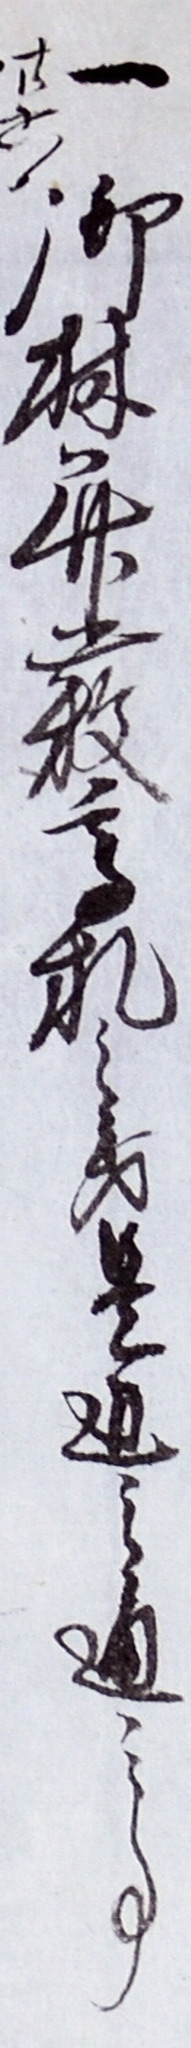一御林并土数高札之義是迄之通之事
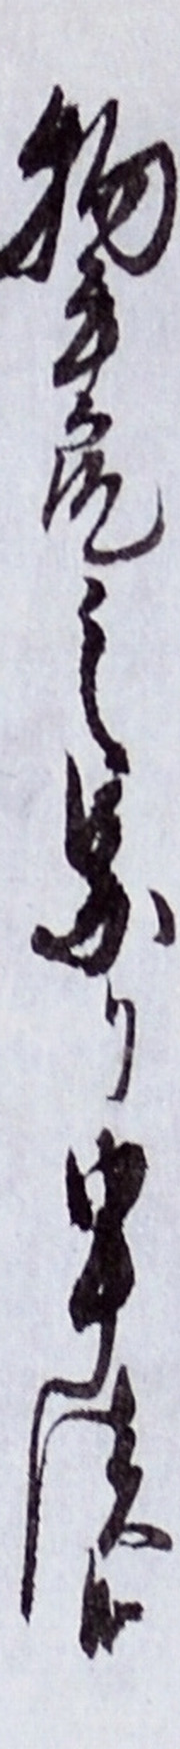物手衆之図り申談候
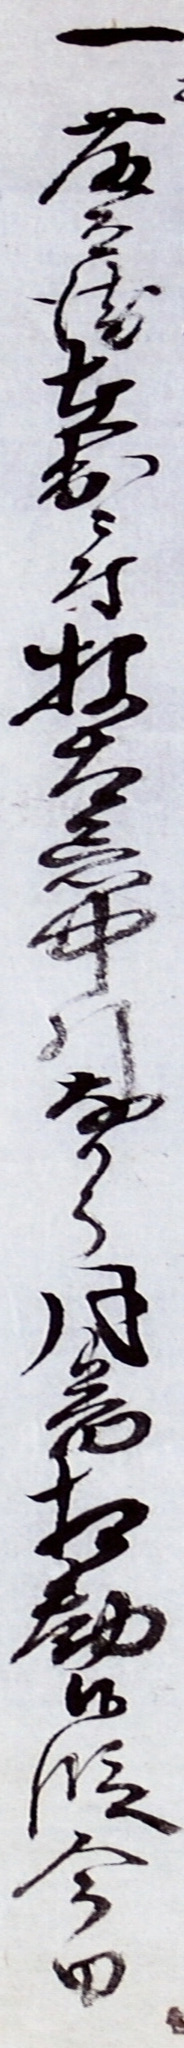一藤兵衛在出ニ付牧太郎忌中引なから月番相勤候段今日
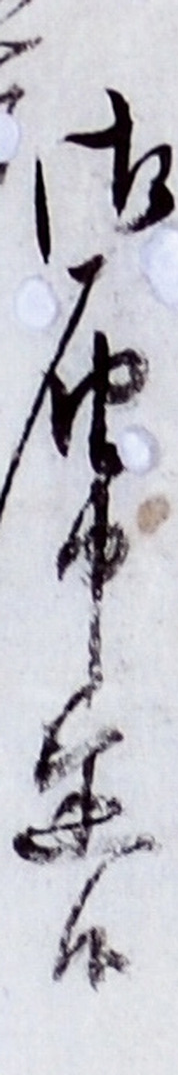御届申達候
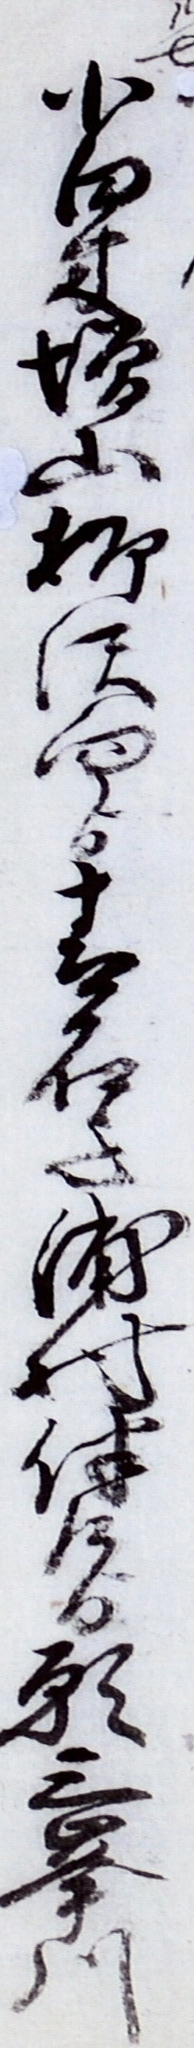一小田木増山柳沢向より青石迄浦村伴左衛門願三峰川
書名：御山奉行御用控
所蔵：伊那市立高遠町図書館・合同会社AMANE
